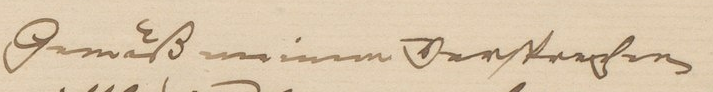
Gemäß meinem Versprechen
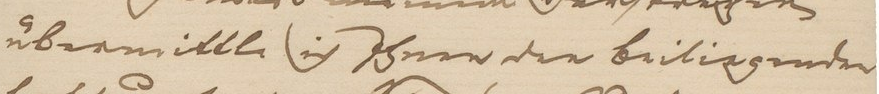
übermittle ich Ihnen den beiliegenden
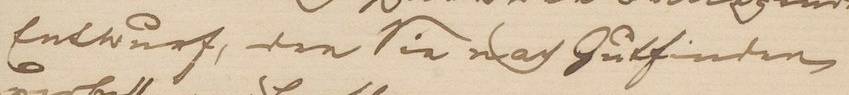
Entwurf, den Sie nach Gutfinden
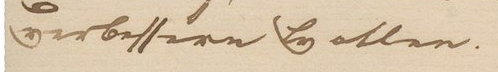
verbessern wollen.
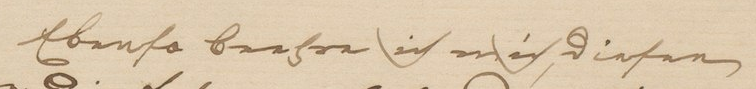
Ebenso beehre ich mich, diesen
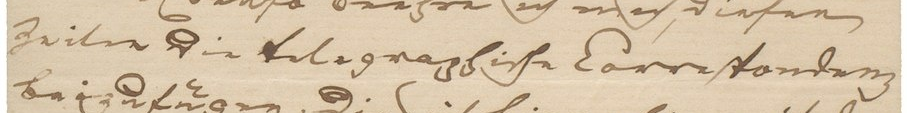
Zeilen die telegraphische Correspondenz
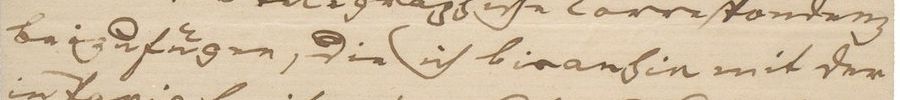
beizufügen, die ich bis anhin mit der
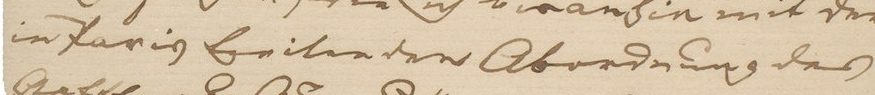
in Paris weilenden Abordnung des
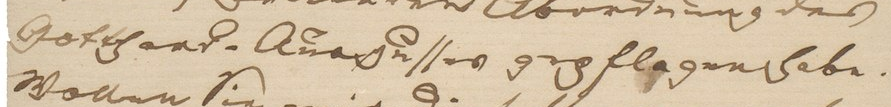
Gotthard-Ausschusses gepflogen habe.
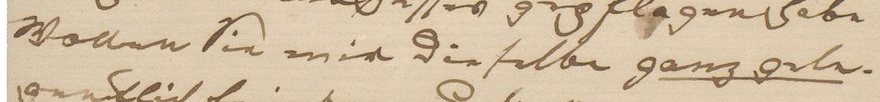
Wollen Sie mir dieselben ganz gele-
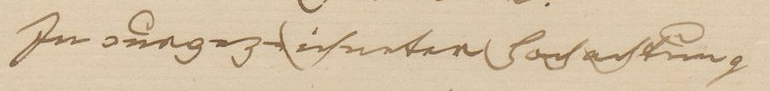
In ausgezeichneter Hochachtung
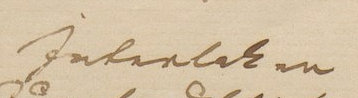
Interlaken
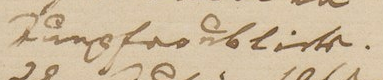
Jungfraublick.
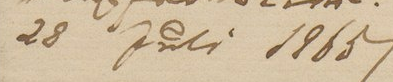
28 Juli 1865
